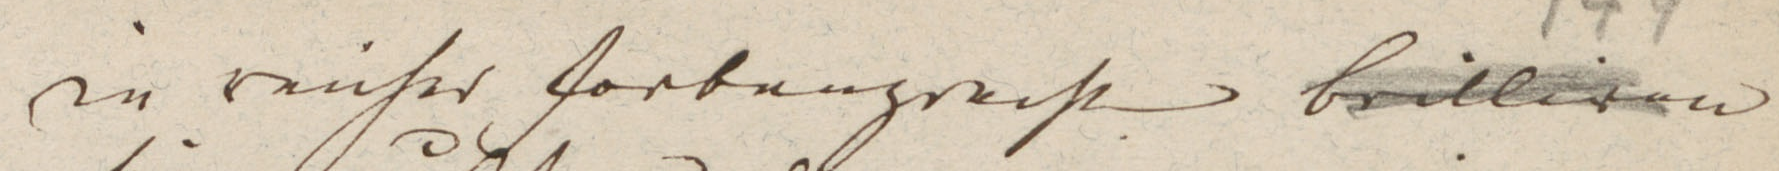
in reicher Farbenpracht brilliren
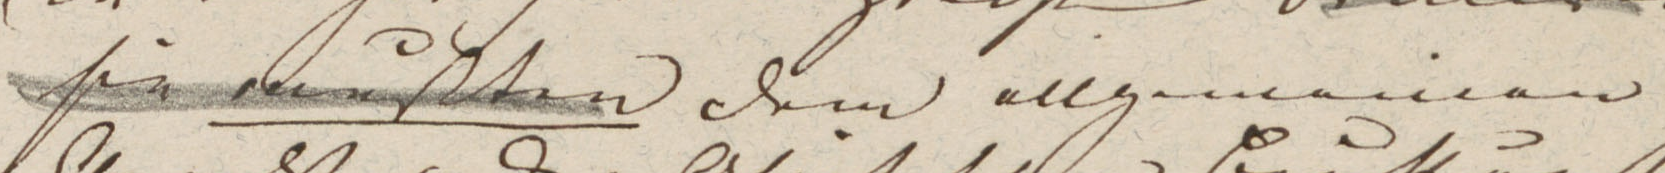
sie mussten dem allgemeinen
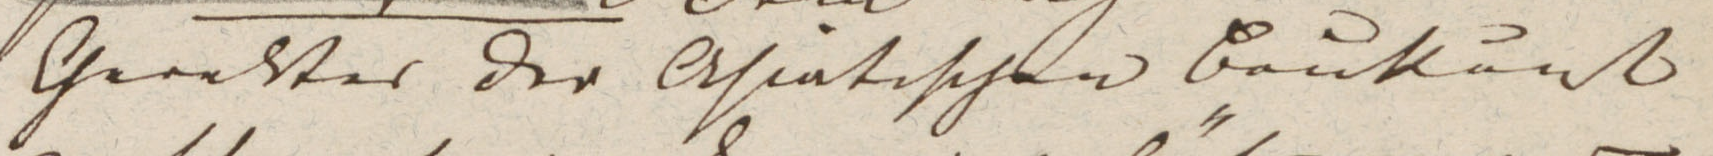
Charakter der Asiatischen Baukunst
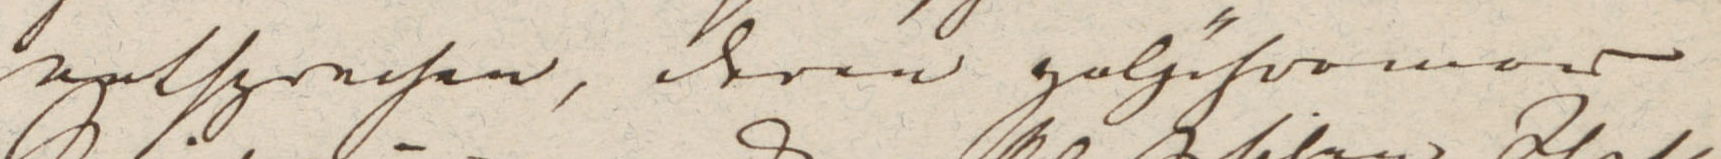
entsprechen, deren polychromer
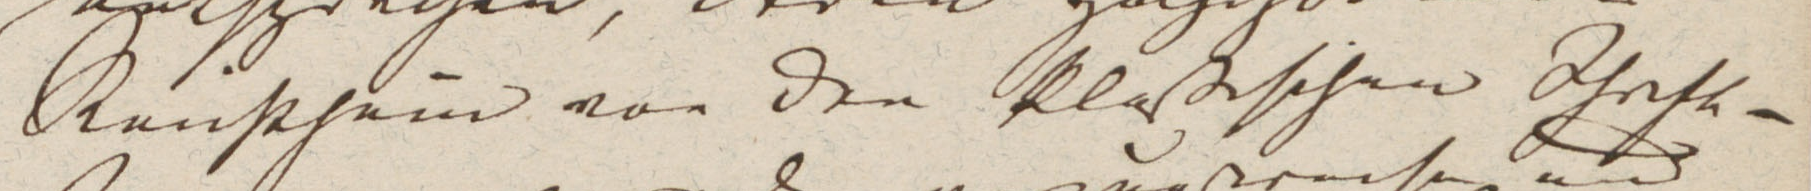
Reichthum von den klassischen Schrift-
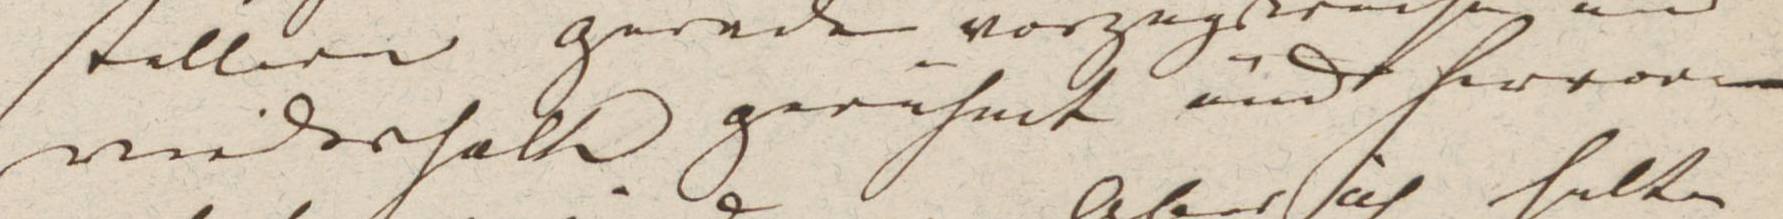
wiederholt gerühmt und hervor-
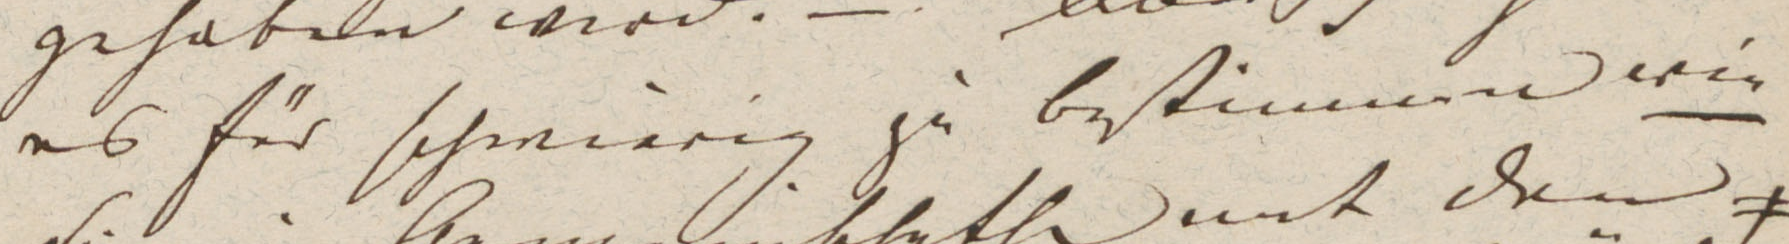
es für schwierig zu bestimmen wie
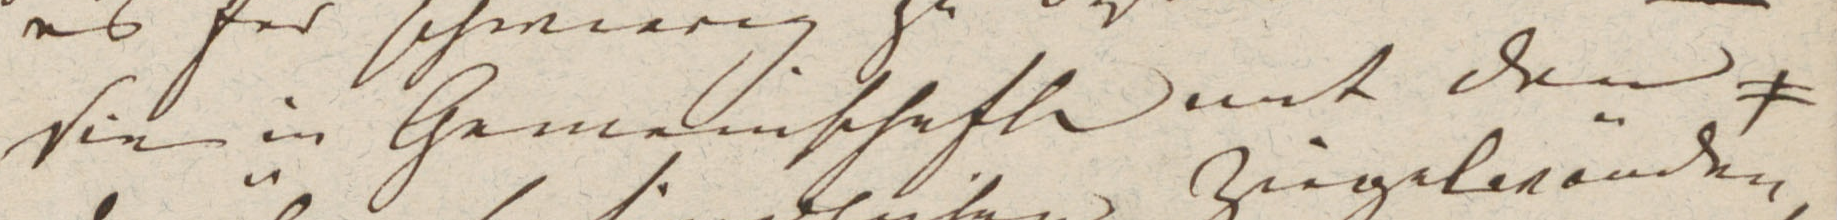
sie in Gemeinschaft mit den
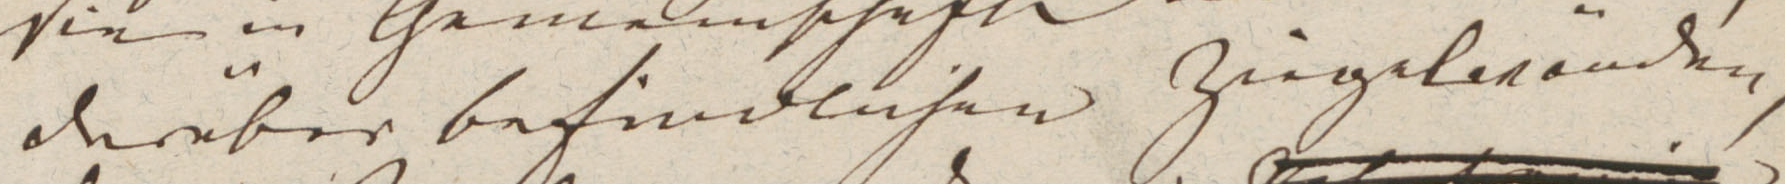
darüber befindlichen Ziegelwänden, %
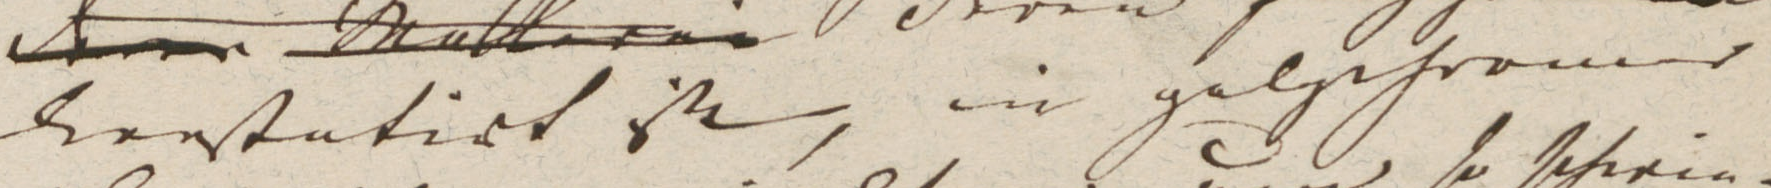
konstatirt ist, in polychromer
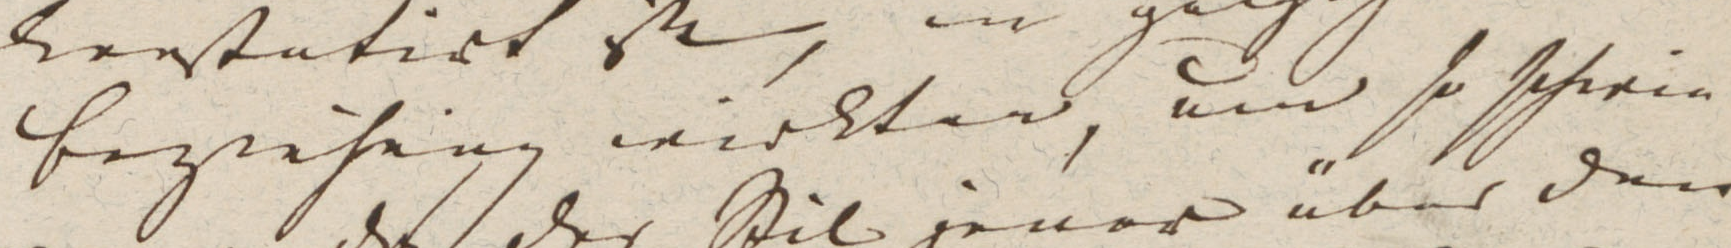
Beziehung wirkten, um so schwie-
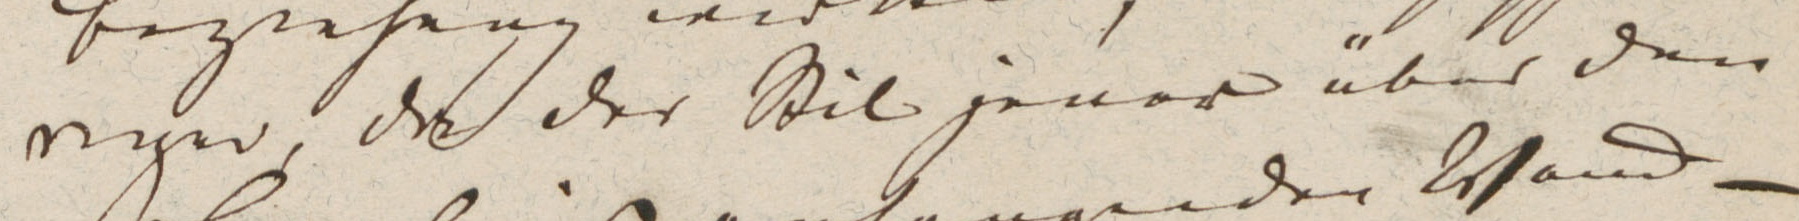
riger, da der Stil jener über den
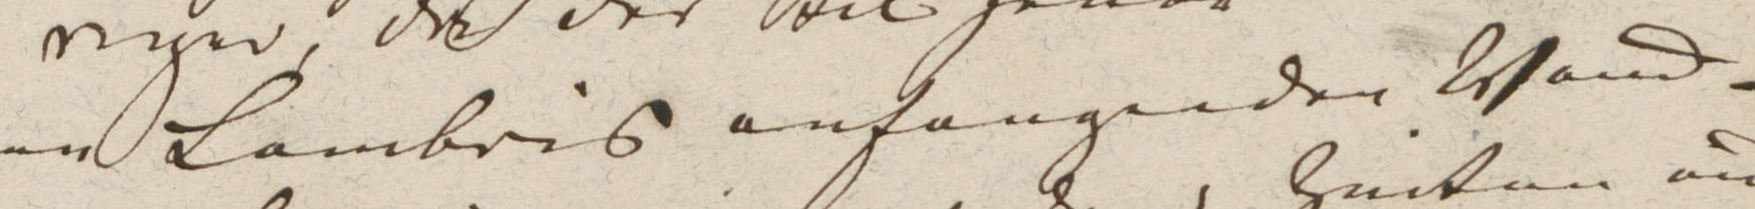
Lambris anfangenden Wand-
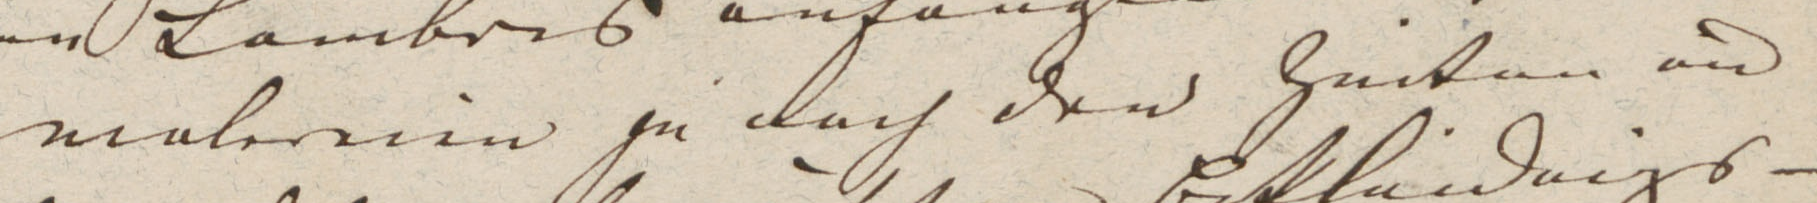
malereien je nach den Zeiten und
